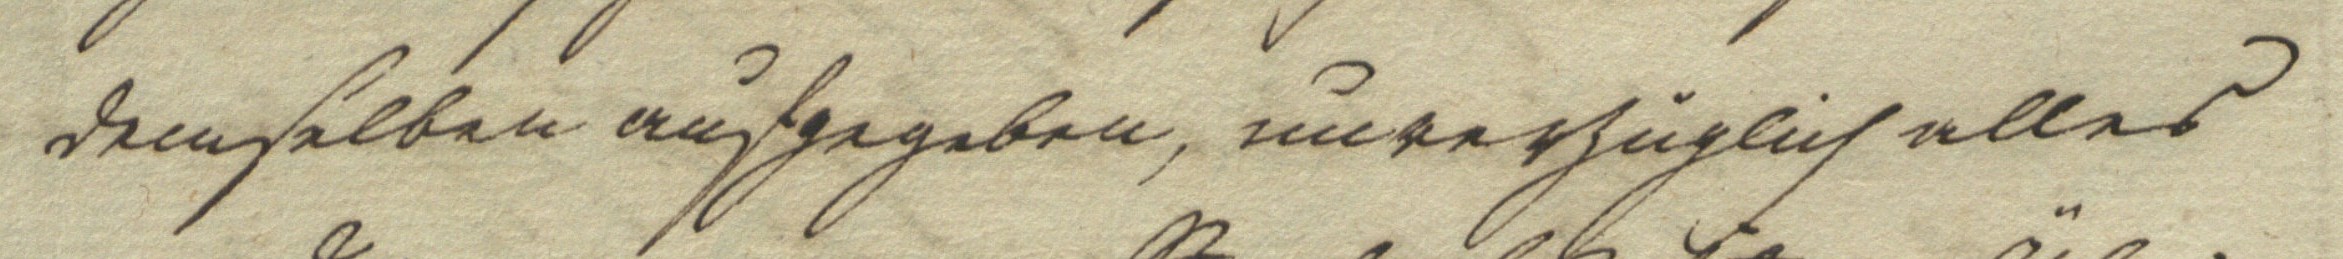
demselben aufgegeben, unverzüglich alles
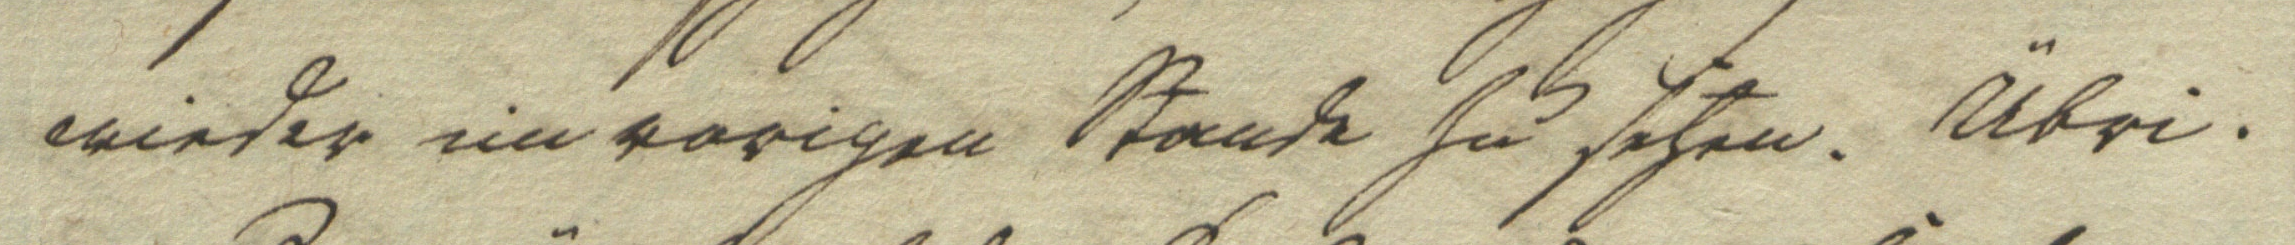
wieder im vorigen Stande zu setzen. Übri¬
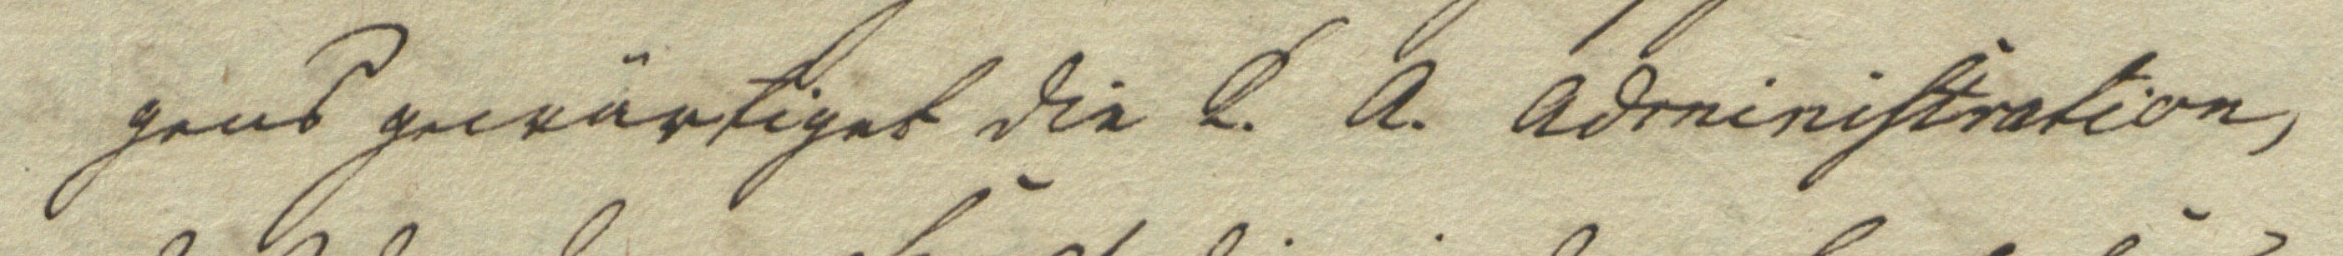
gens gewärtiget die K. A. Administration,
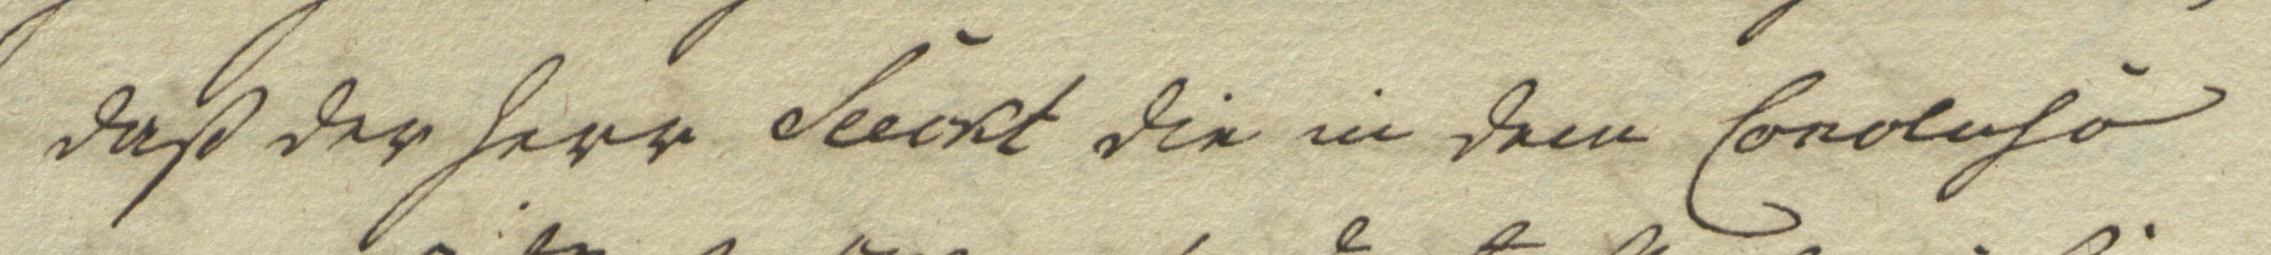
daß der Herr Seeckt die in dem Concluso
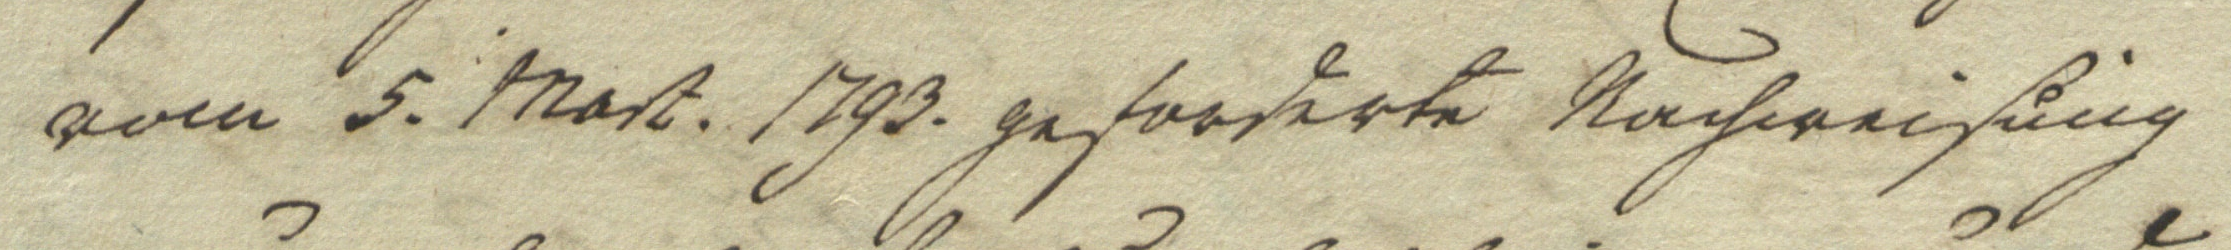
vom 5. Mart. 1793. geforderte Nachweisung
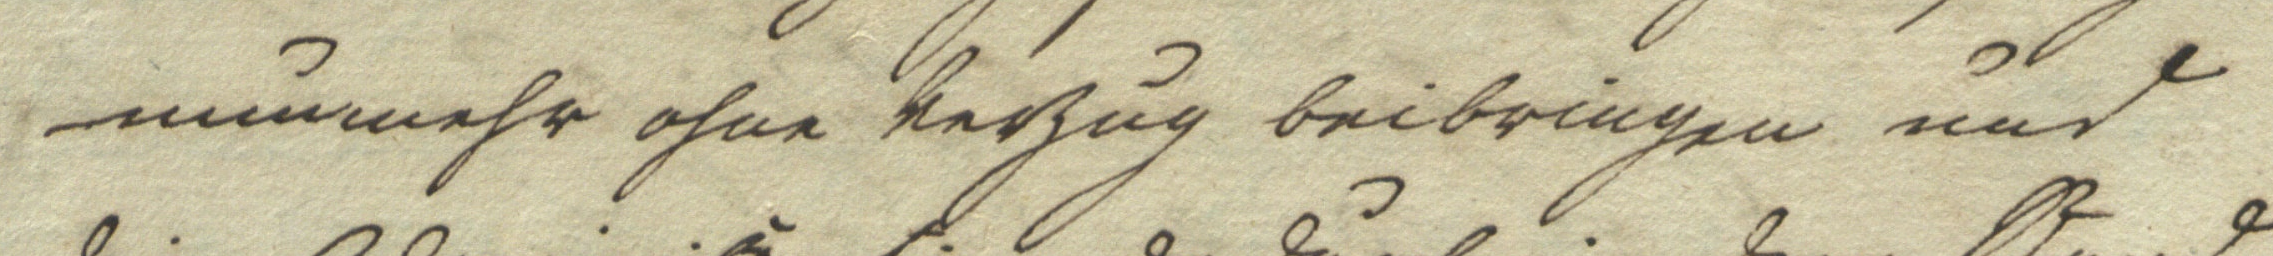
nunmehr ohne Verzug beibringen und
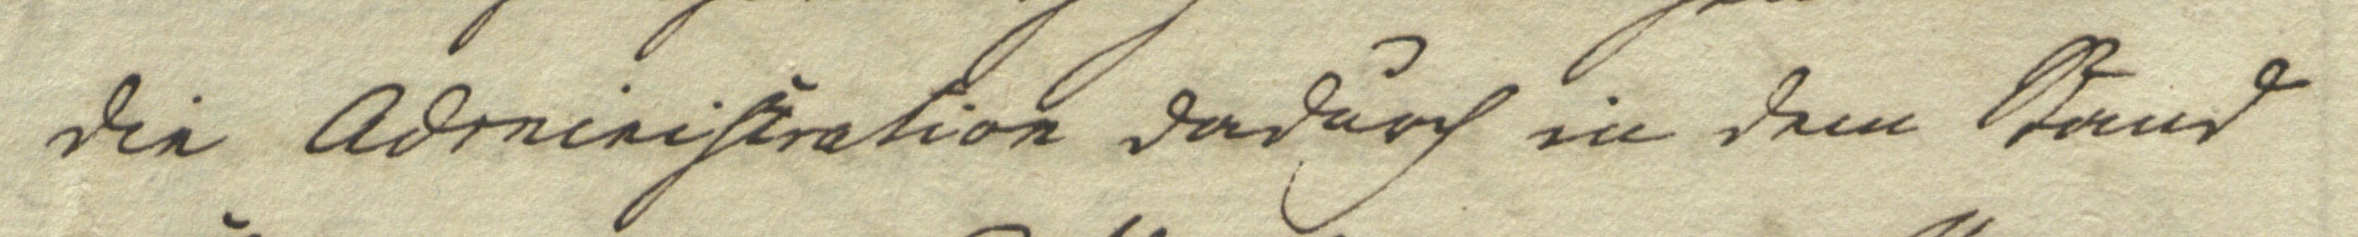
die Administration dadurch in dem Stand
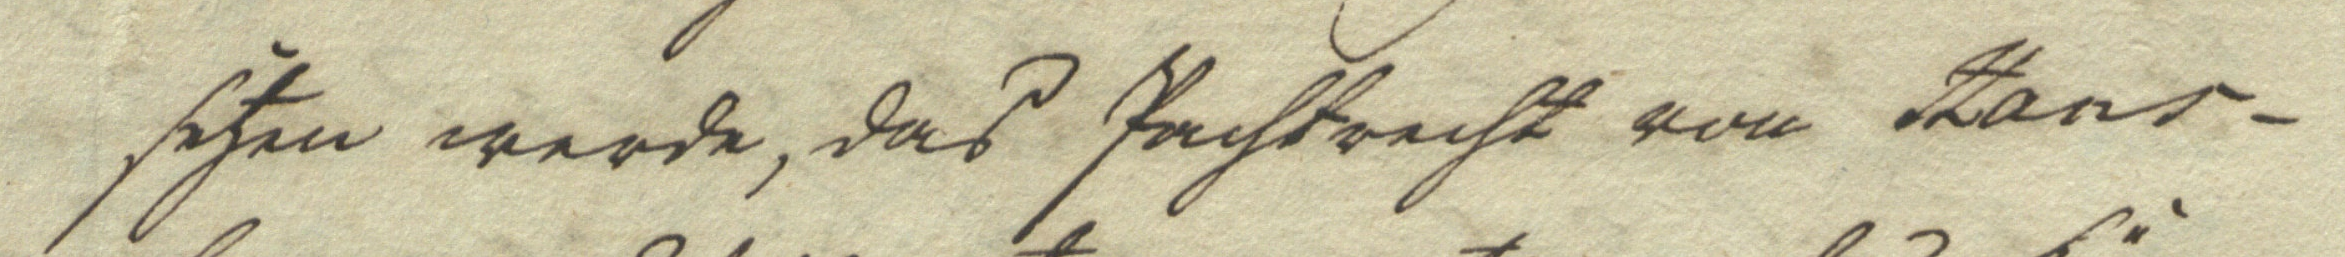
setzen werde, das Pachtrecht von Hans¬
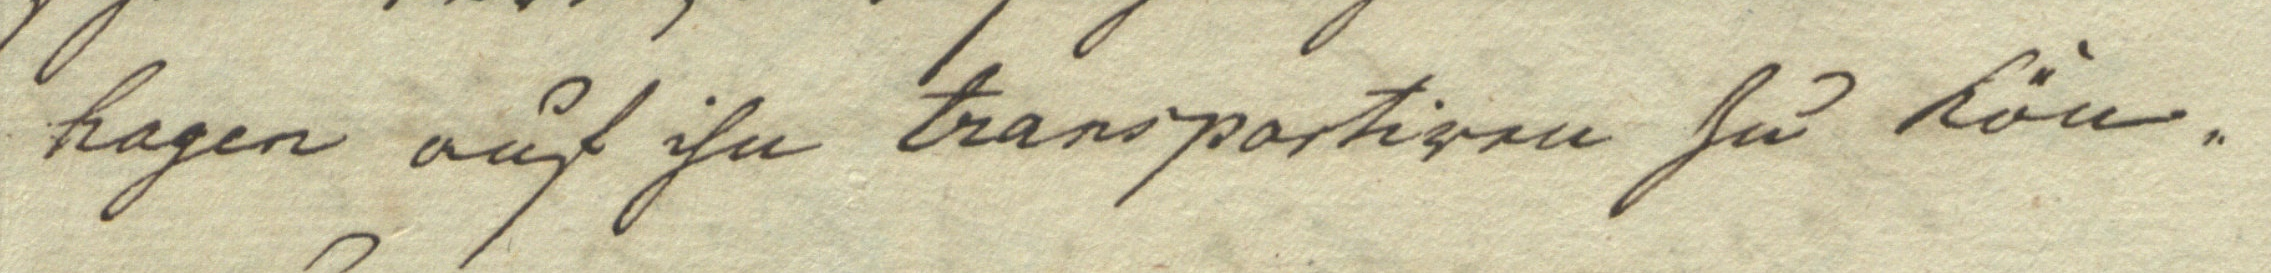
haben auf ihn transportiren zu kön¬
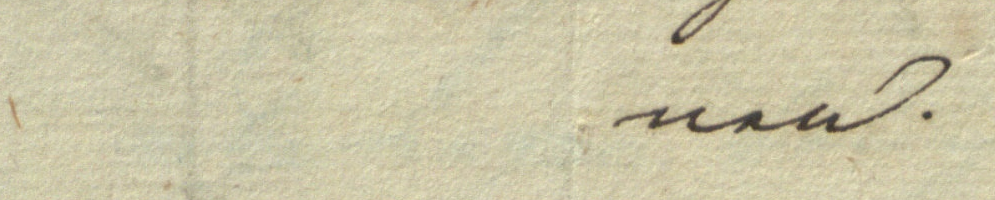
nen.
